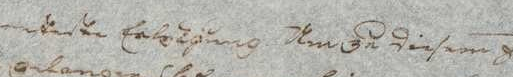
ernsteste Erwägung. Um zu diesem
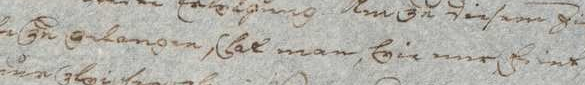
le zu gelangen, hat man, wie mir scheint,
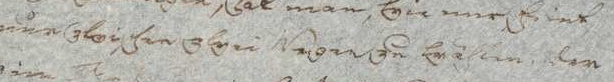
nur zwischen zwei Wegen zu wählen, der
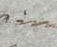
eine
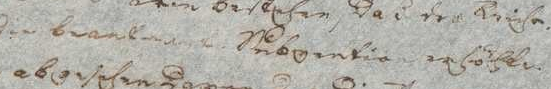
die beantragte Subvention erhöhte.
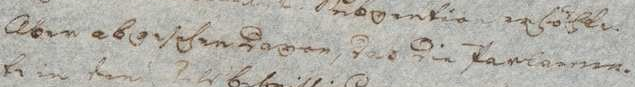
Aber abgesehen davon, daß die Parlamen-
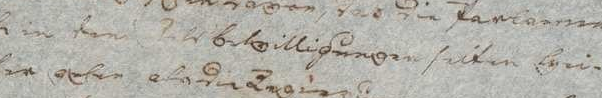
te in den Geldbewilligungen selten wei-
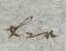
ter
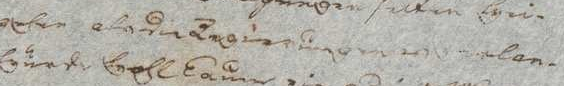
gehen, als die Regierungen es verlan-
